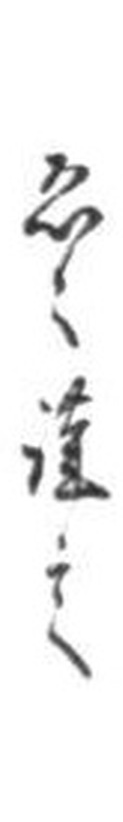恐々謹言
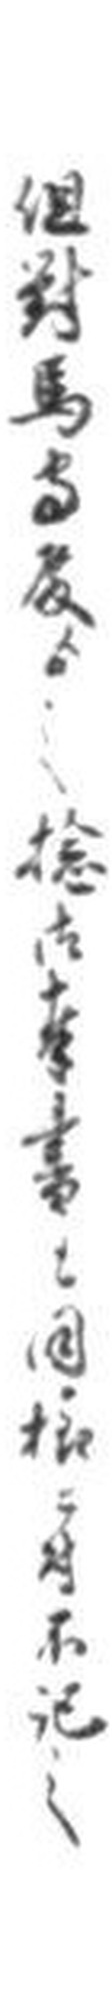但対馬守殿ゟ之捻御奉書も同様ニ付不記之
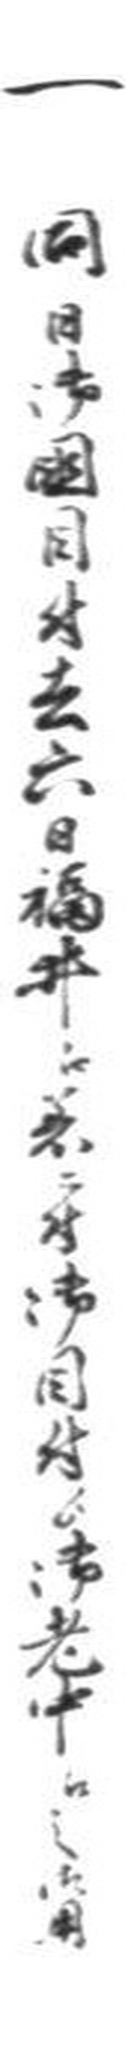一同日御国目付去六日福井江着ニ付御目付ゟ御老中江之御用
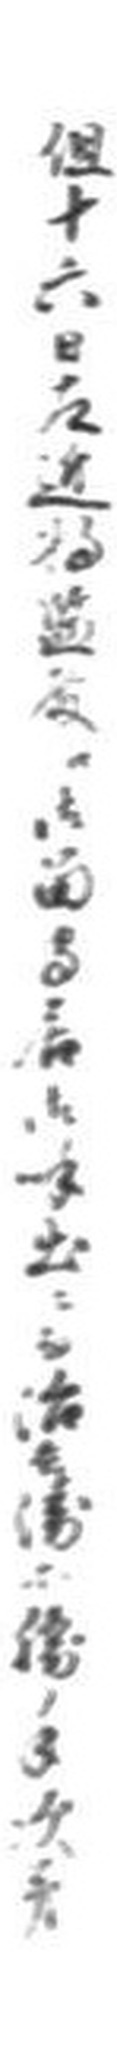但十六日左近将監殿江御留守居御呼出ニ而治兵衛等勝手次第
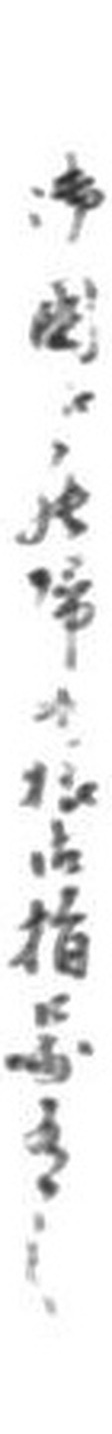御国江罷帰候様御指図有之
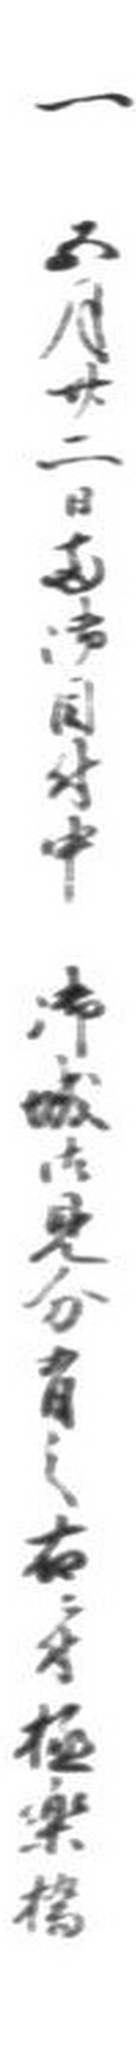一五月廿二日両御目付中御城御見分有之右ニ付極楽橋
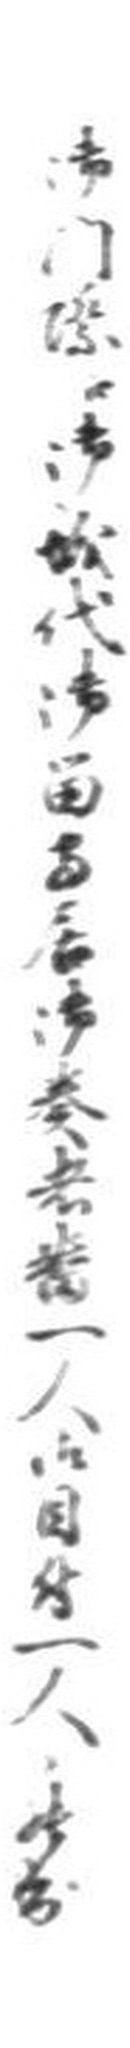御門際江御城代御留守居御奏者番一人御目付一人罷出
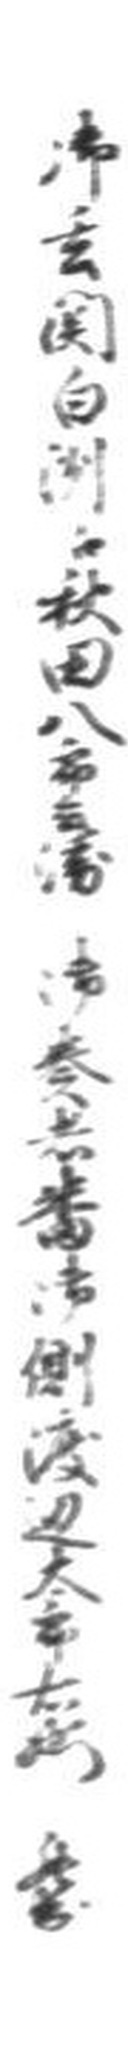御玄関白洲江秋田八郎兵衛御奏者番御側渡辺太郎右衛門罷出
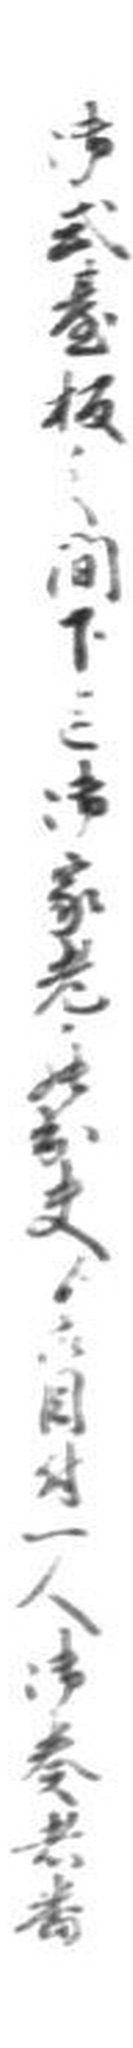御式台板之間下迄御家老罷出夫ゟ御目付一人御奏者番
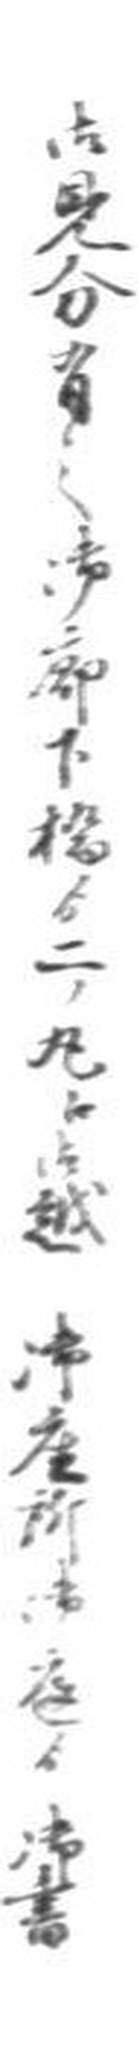御見分有之御廊下橋ゟ二ノ丸江御越御座所御庭ゟ御書

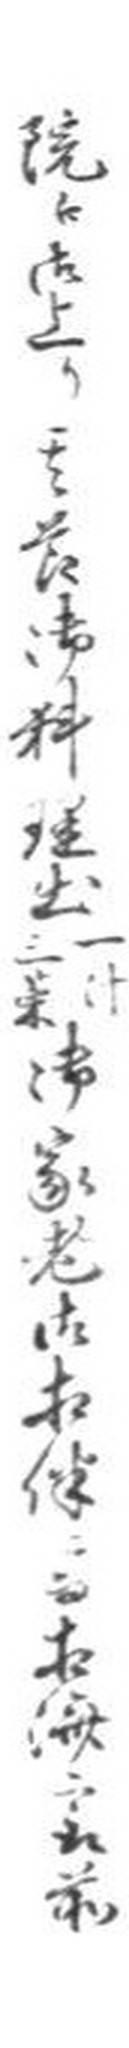院江御上り其節御料理出一汁三菜御家老御相伴ニ而相済最前
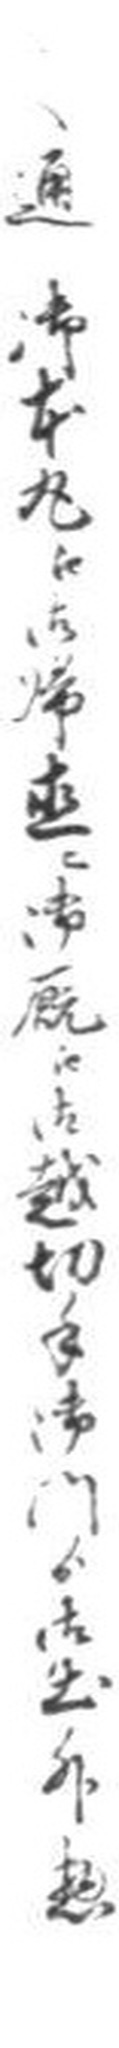之通御本丸江御帰直ニ御厩江御越切手御門ゟ御出外惣
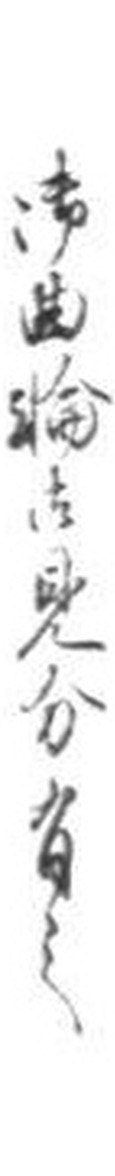御曲輪御見分有之
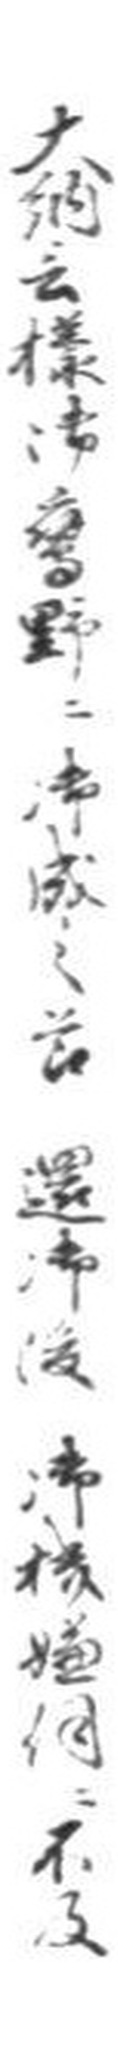大納言様御鷹野ニ御成之節還御後御機嫌伺ニ不及
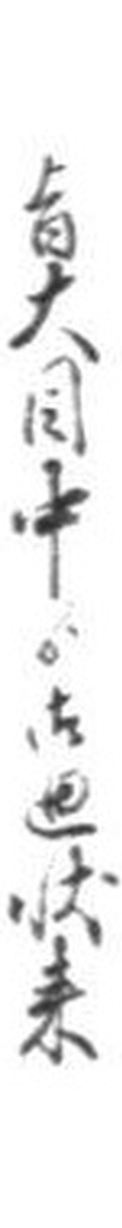旨大目中ゟ御廻状来
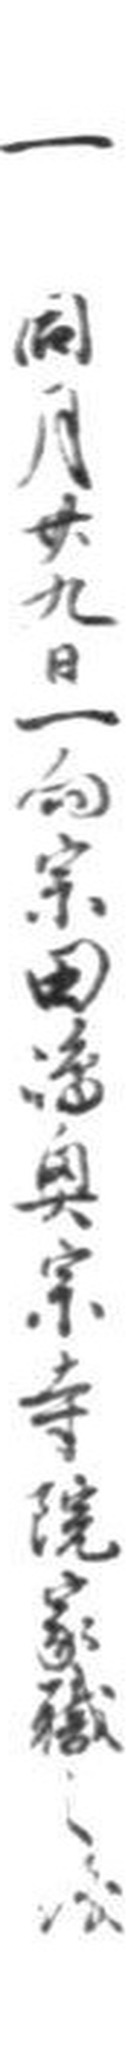一同月廿九日一向宗田嶋興宗寺院家職之儀
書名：家譜 三十九 宗矩公 享保十年
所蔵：福井県文書館 Fukui Prefectural Archives
